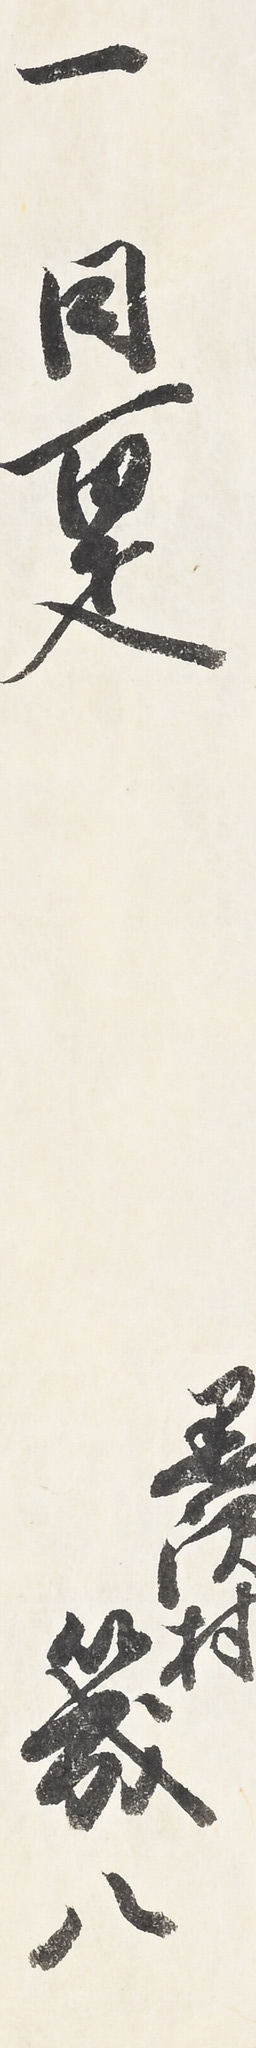一同百疋幾八
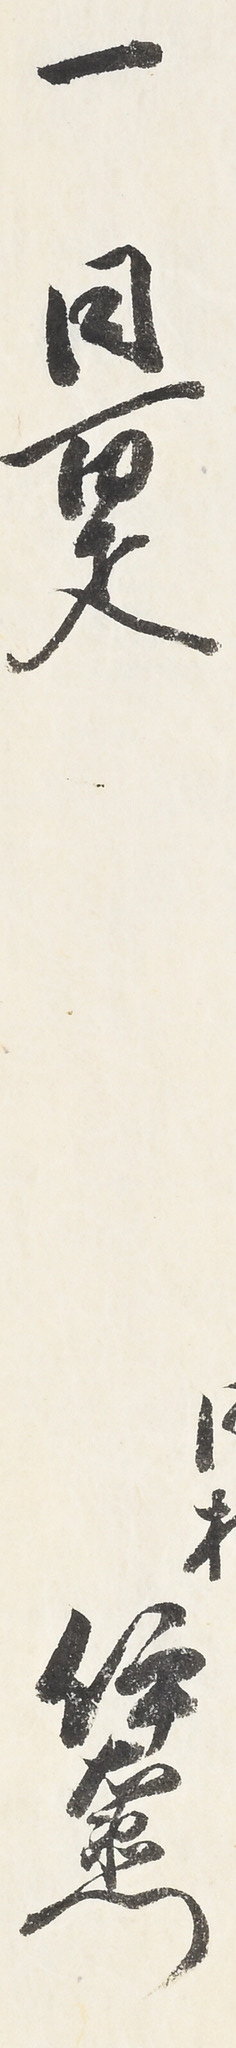一同百疋伊右衛門
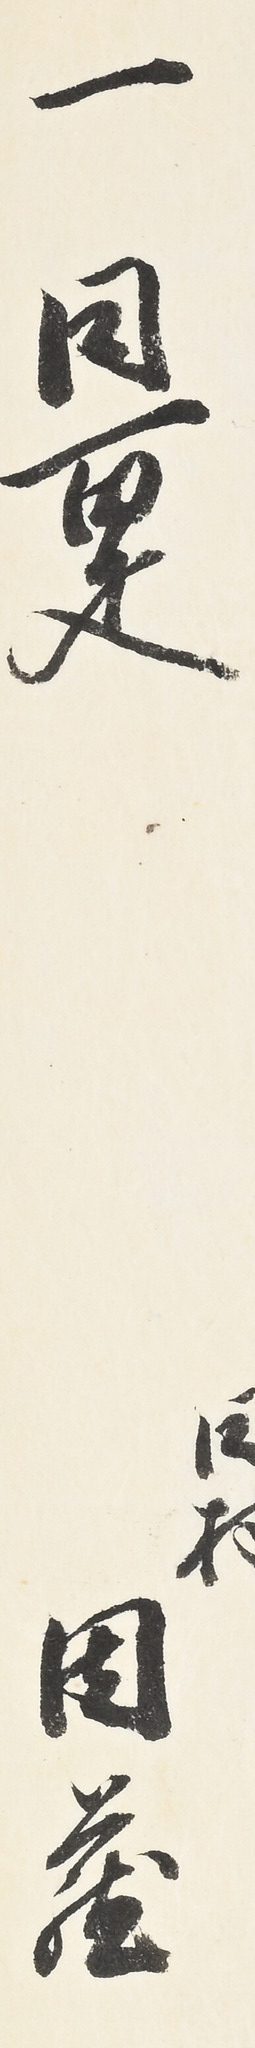一同百疋周蔵
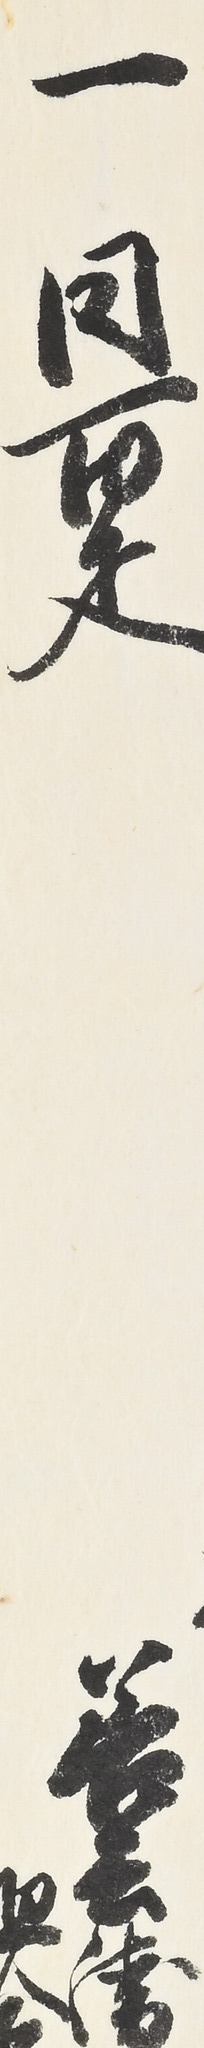一同百疋善兵衛
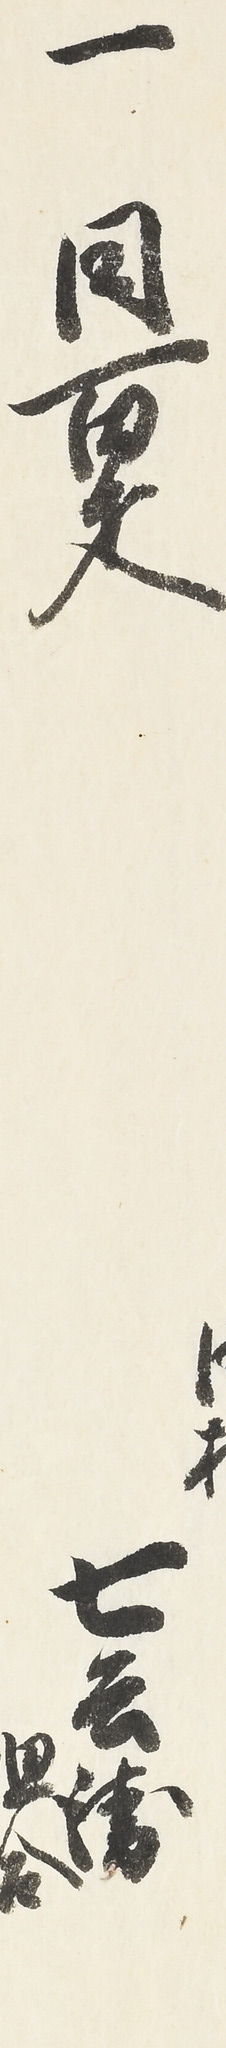一同百疋七兵衛

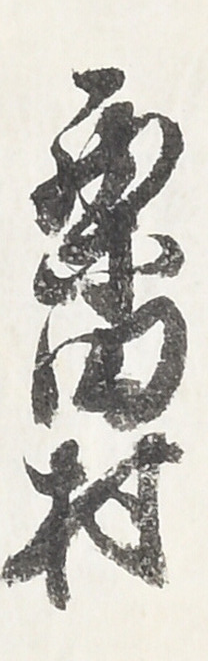栗田村
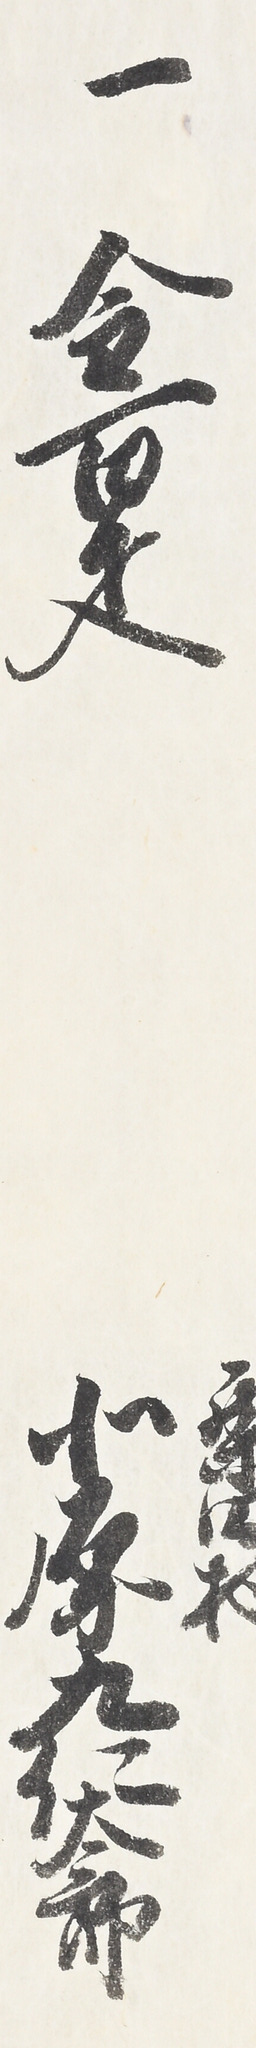一金百疋北原九仁太郎
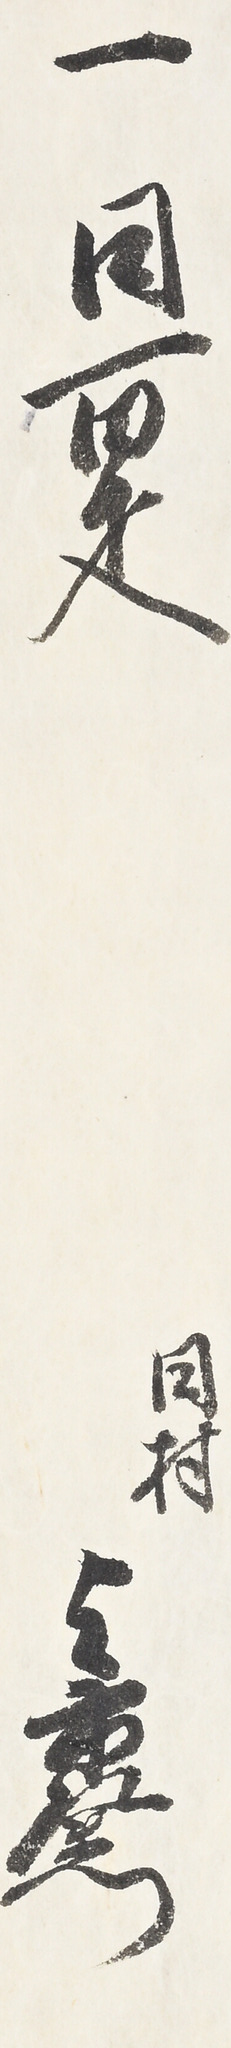一同百疋与市左衛門
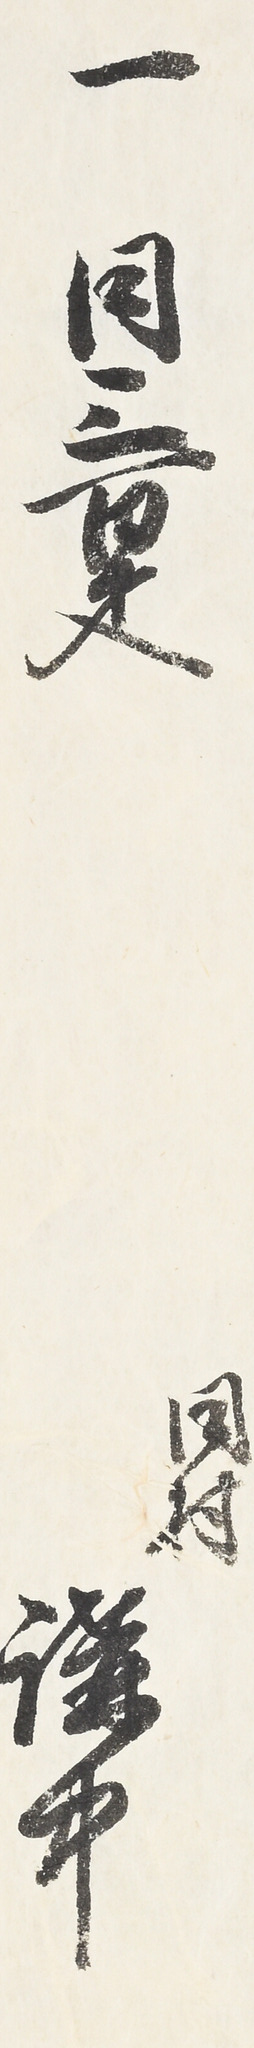一同三百疋講中
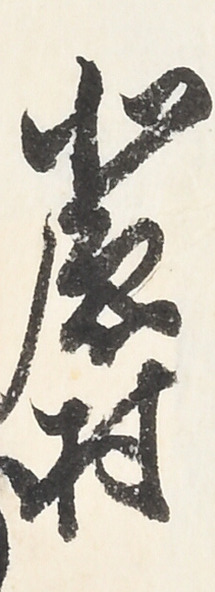北原村
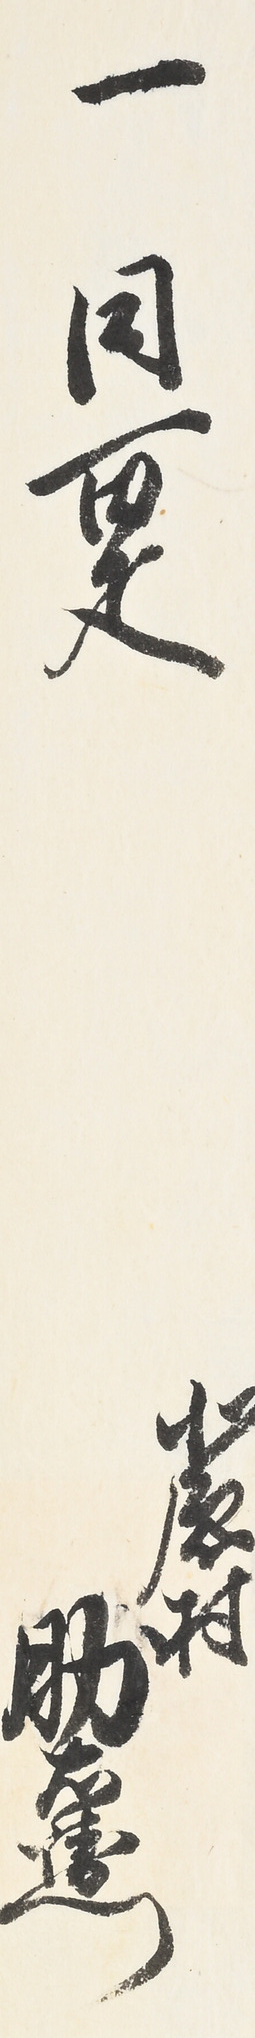一同百疋助右衛門
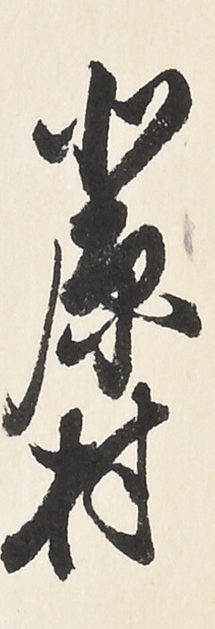北原村
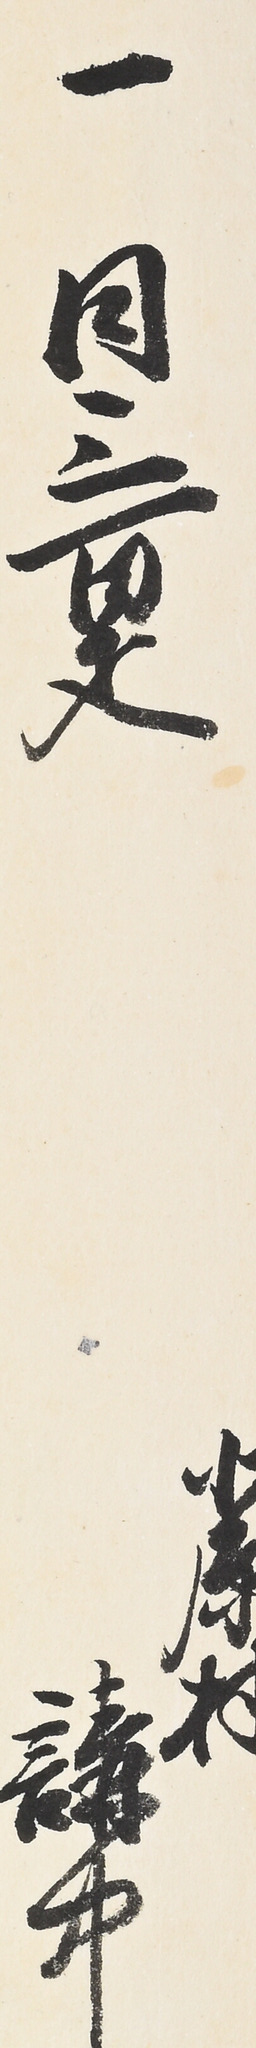一同三百疋講中
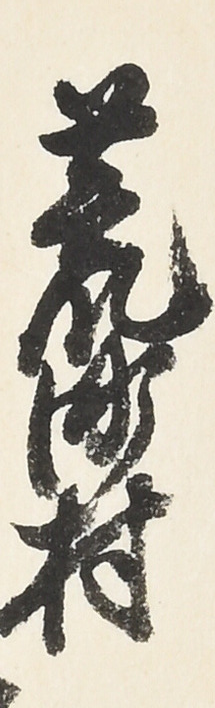荒町村
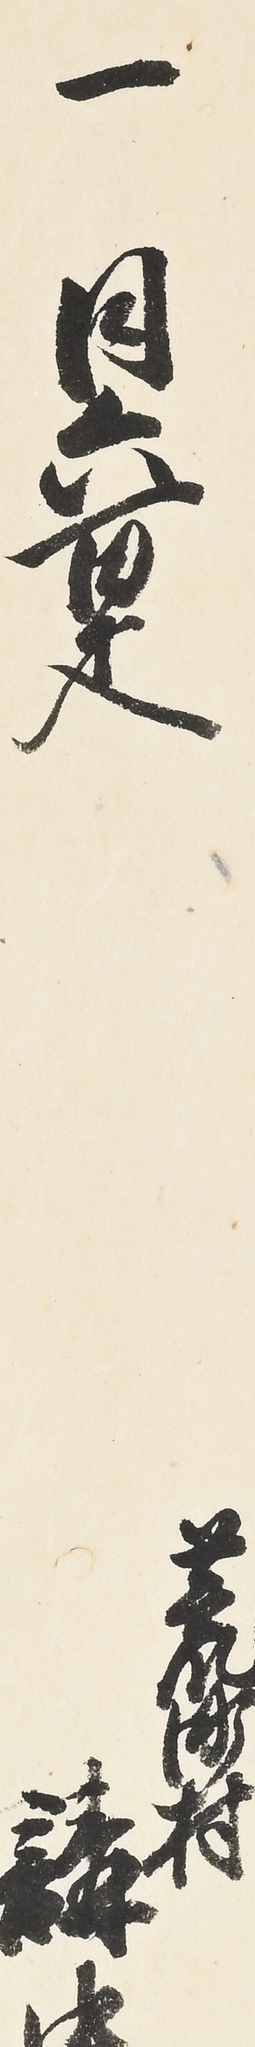一同六百疋講中
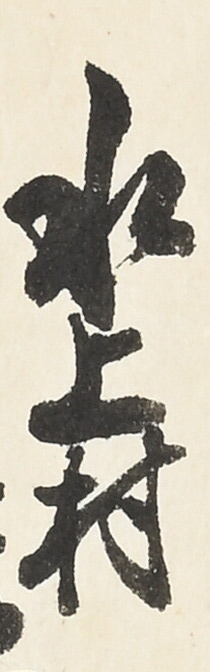水上村
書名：永代太々御神楽名前帳
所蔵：伊那市立高遠町図書館・合同会社AMANE
